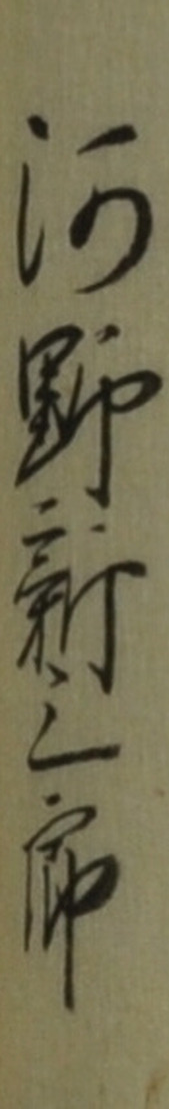河野新三郎
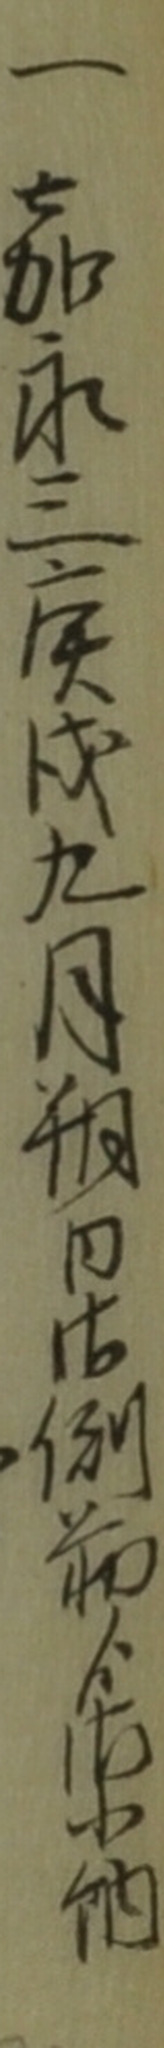一嘉永三庚戌九月朔日御側勤ゟ御小納
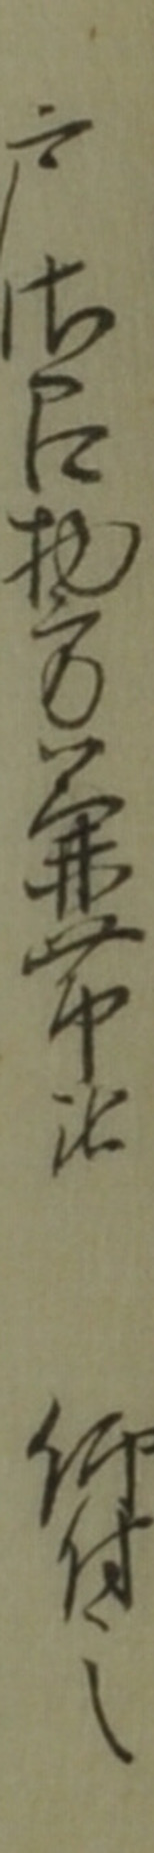戸御召物方兼帯被仰付之
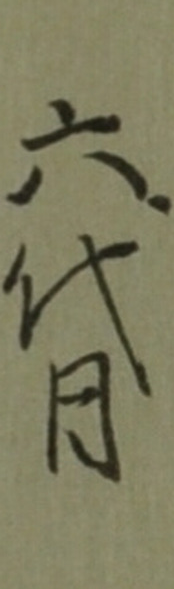六代目
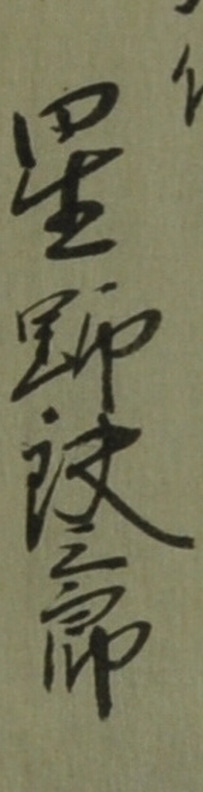星野鉄三郎
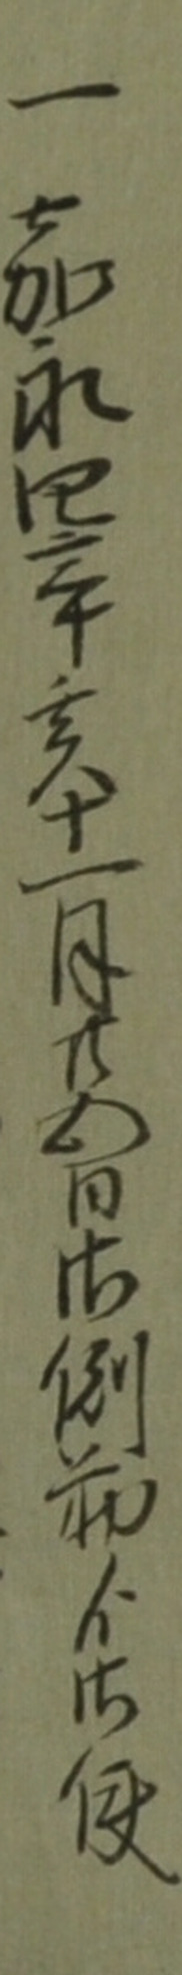一嘉永四辛亥十一月廿五日御側勤ゟ御使
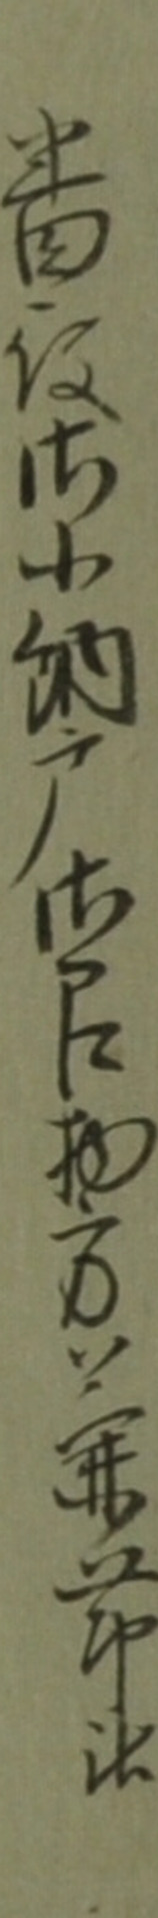番役御小納戸御召物方兼帯被
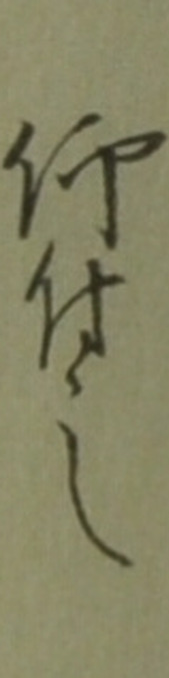仰付之

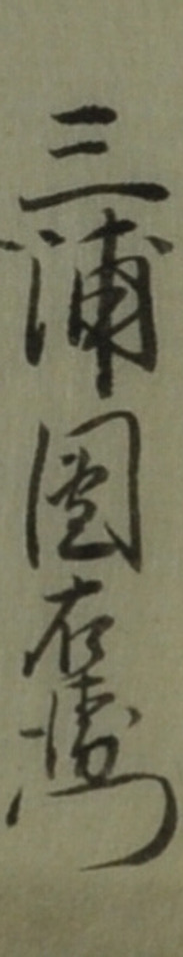三浦團右衛門
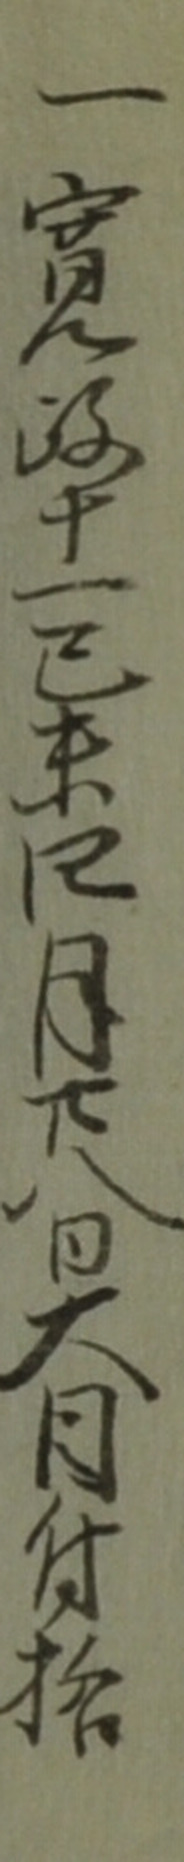一寛政十一己未四月廿八日大目付格
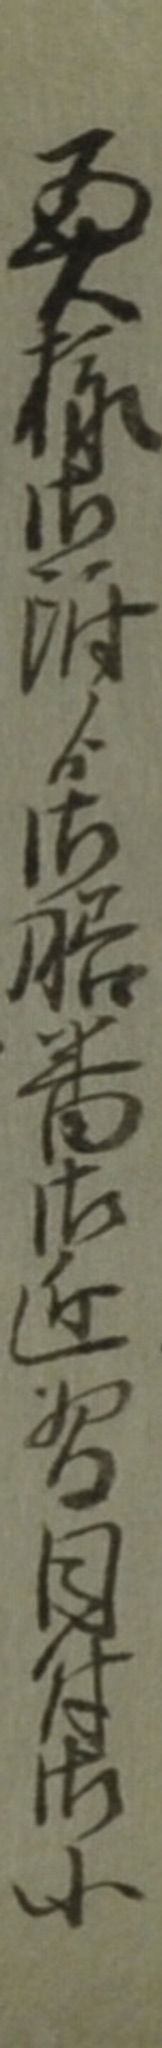奥様御附ゟ御膳番御近習目付御小
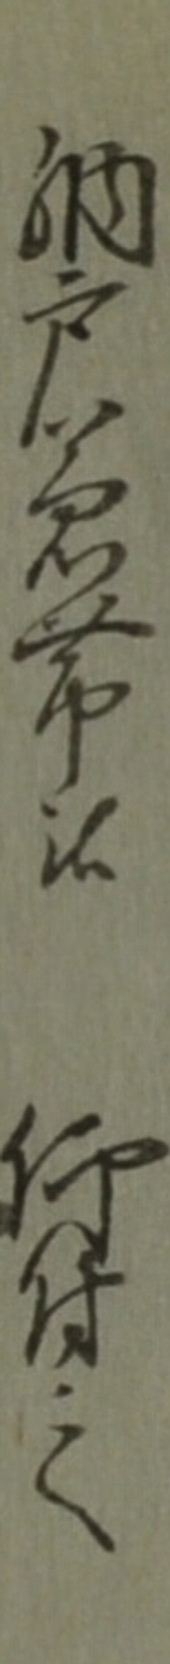納戸兼帯被仰付之
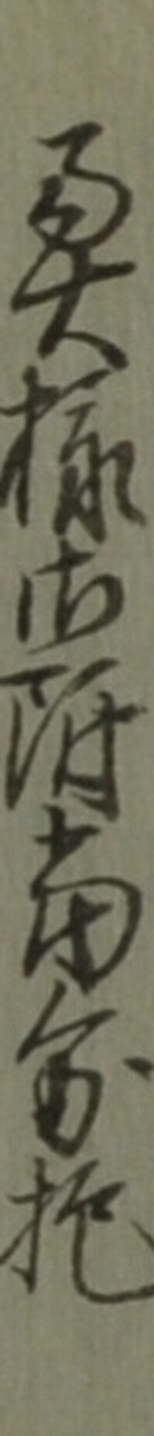奥様御附当分抱
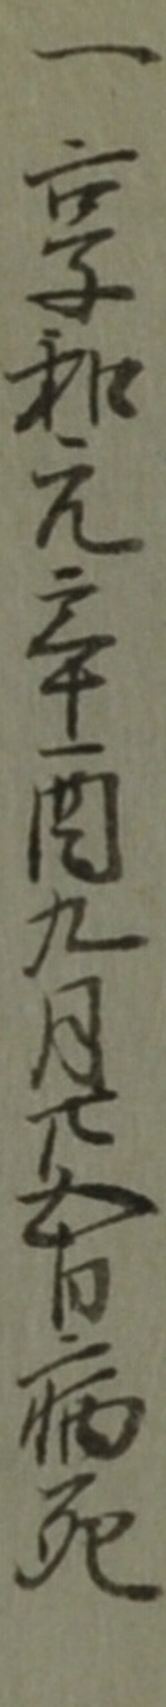一享和元辛酉九月廿五日病死
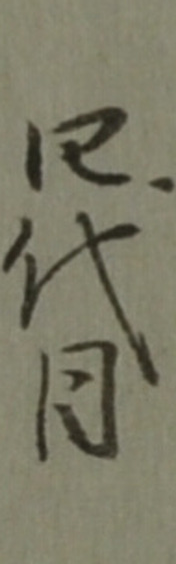四代目
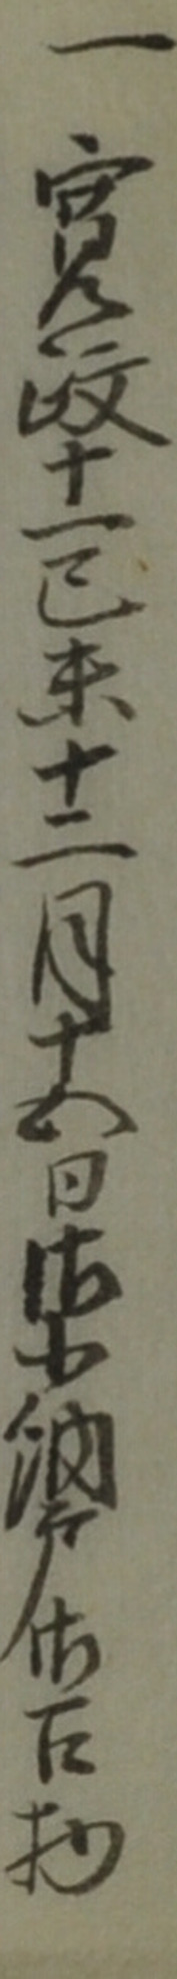一寛政十一己未十二月十五日御小納戸御召物
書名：諸御役代々録（四）
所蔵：伊那市立高遠町図書館・合同会社AMANE
